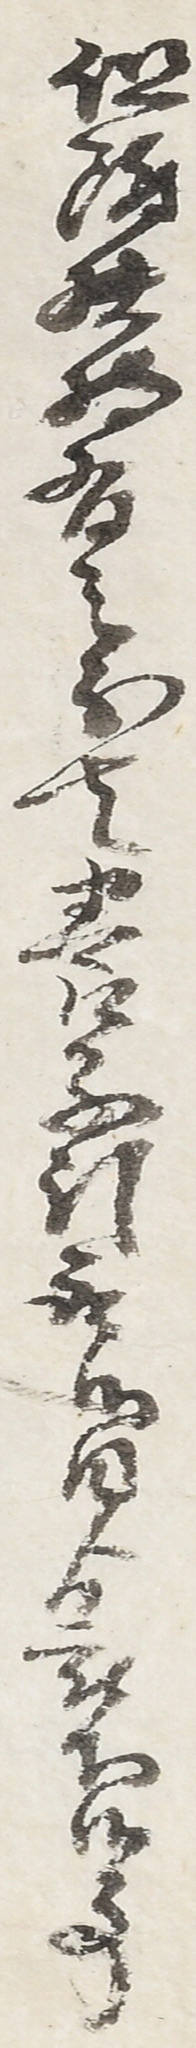但附扶持有之分は養子引取候月ゟ被下候事」

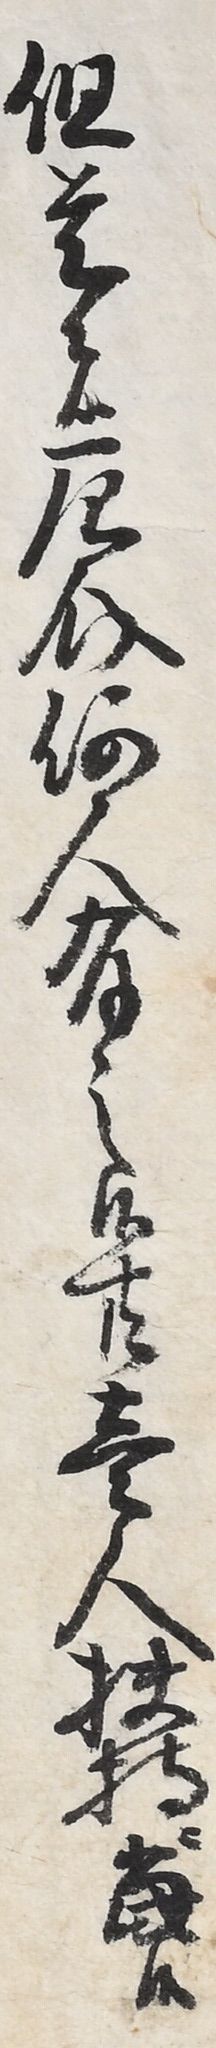但是は厄介何人有之候共壱人扶持ニ当候
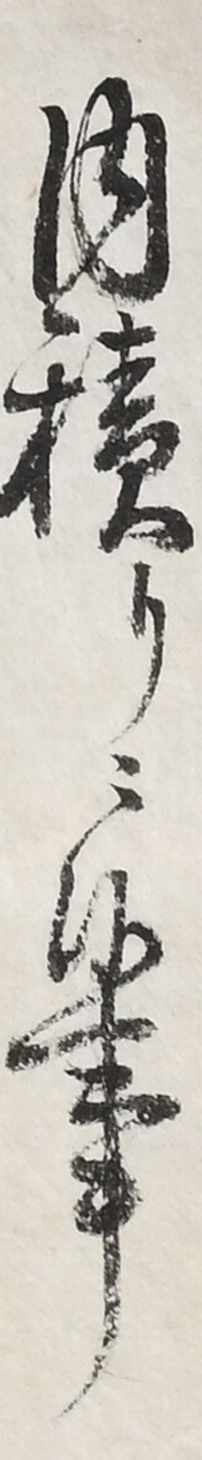内積リニ候事
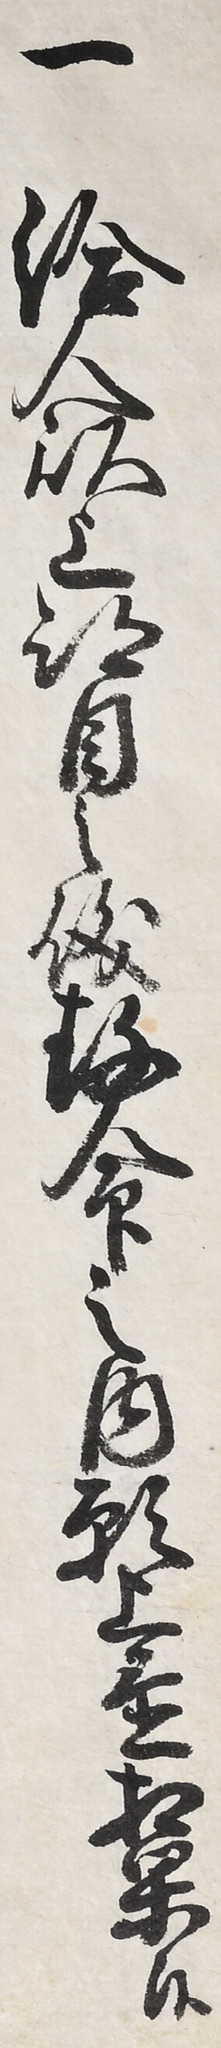一給人以上跡目之儀存命之内願上置相果候
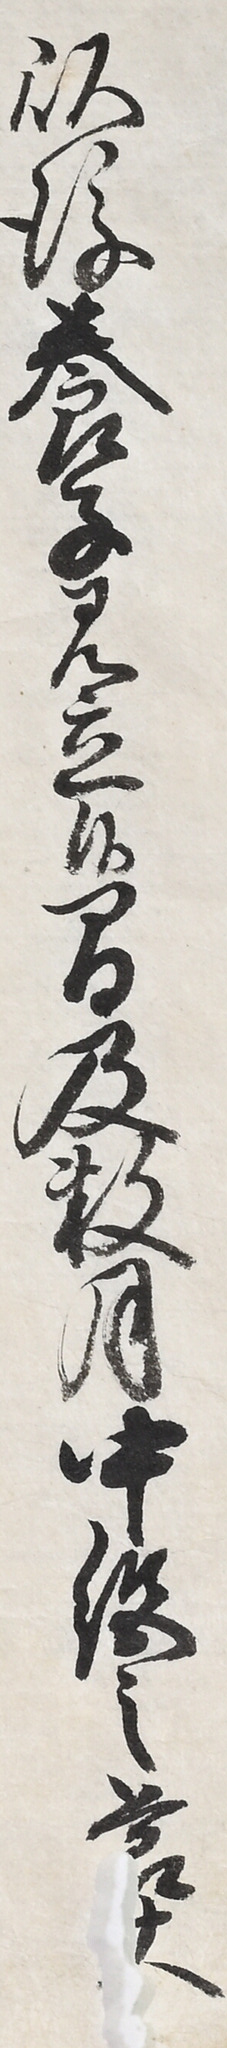以後養子見立候間及数月中絶之節
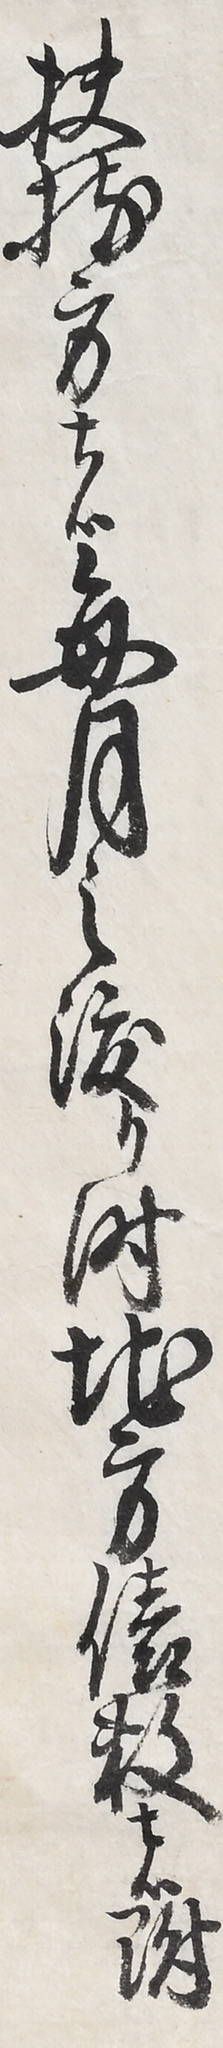扶持可は毎月之渡リ時地方俵数は附
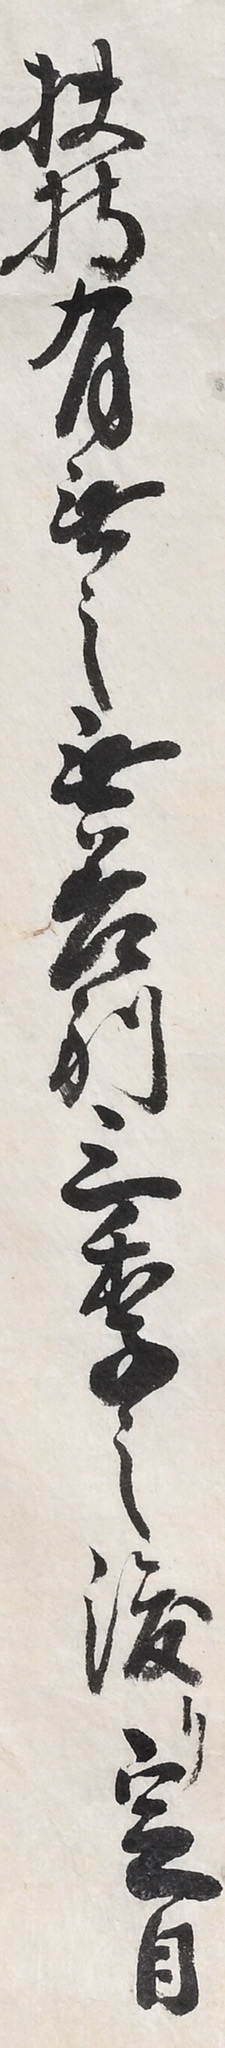扶持有無之無差別三季之渡リ定月
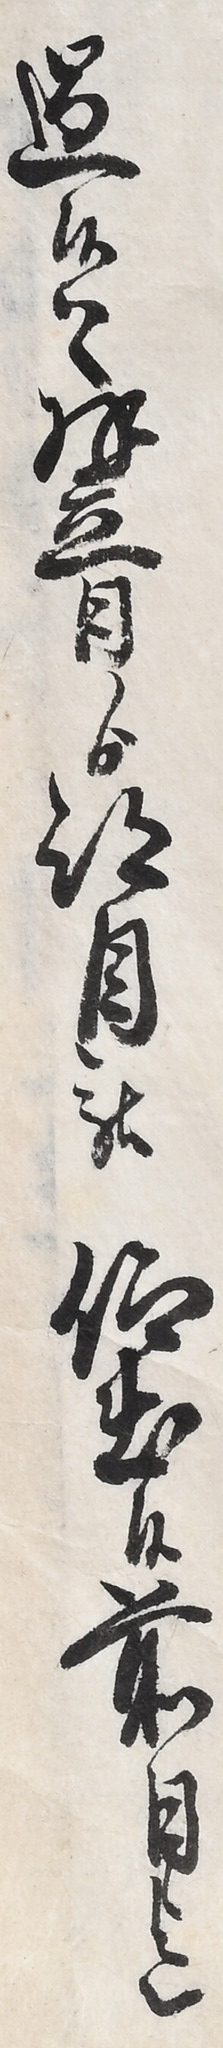過候ハヽ翌日ゟ跡目被仰出候前日迄
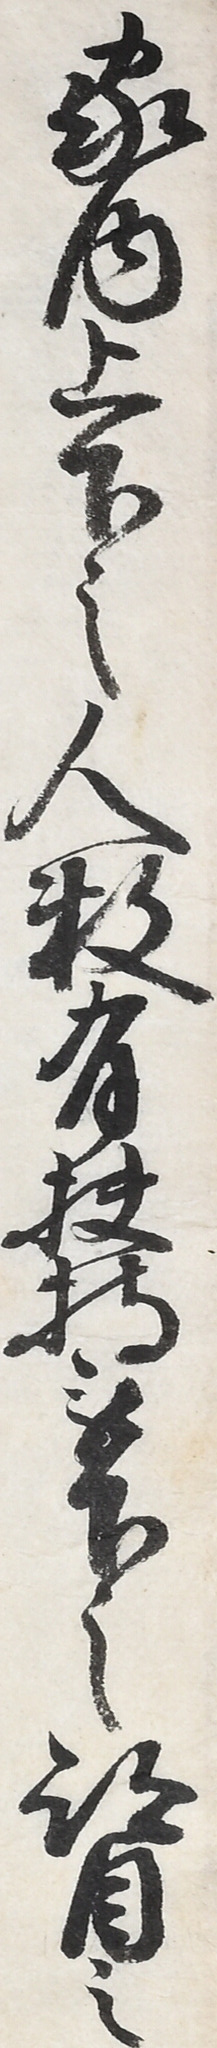家内上下之人数有扶持被下之跡目之
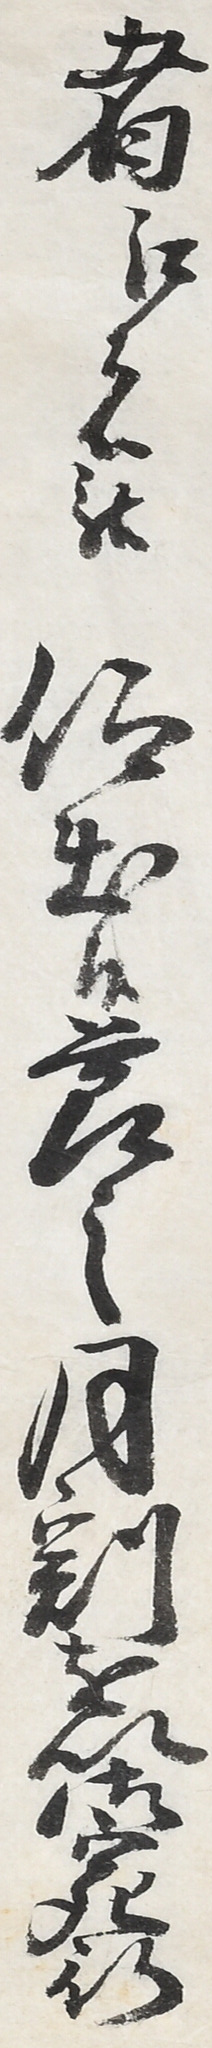者江は被仰出候節之月割を以御宛行
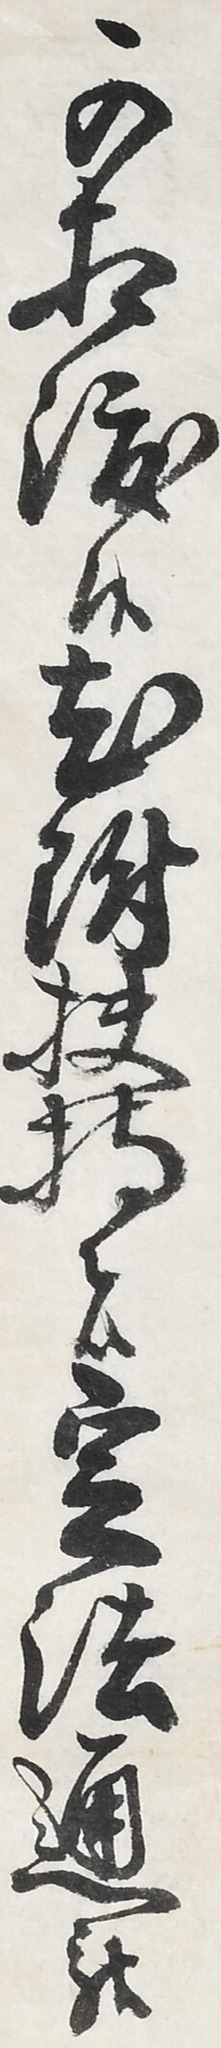可相渡候尤附扶持は定法通被
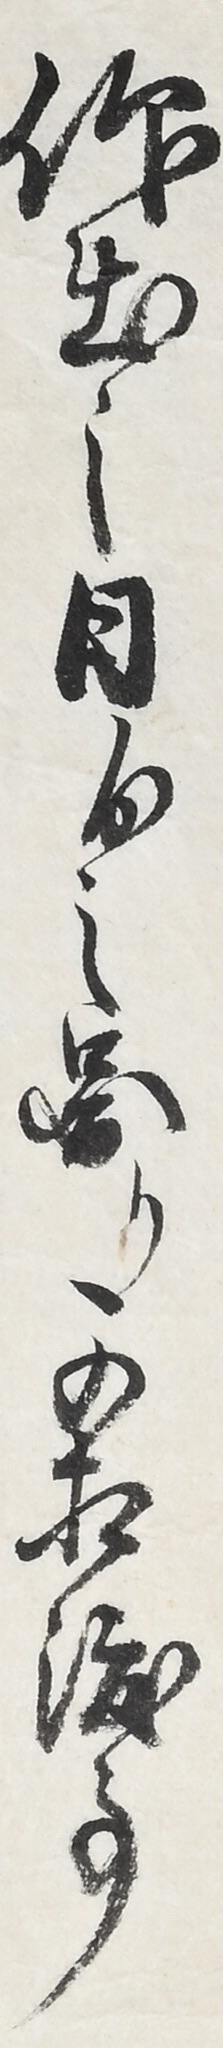仰出之日ゟ之図リ可相渡事
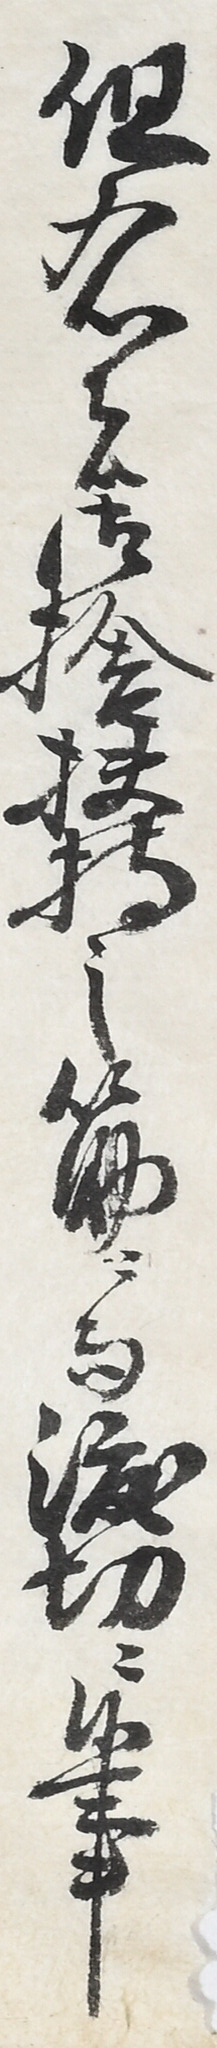但右は御捨扶持之筋ニ而渡切ニ候事
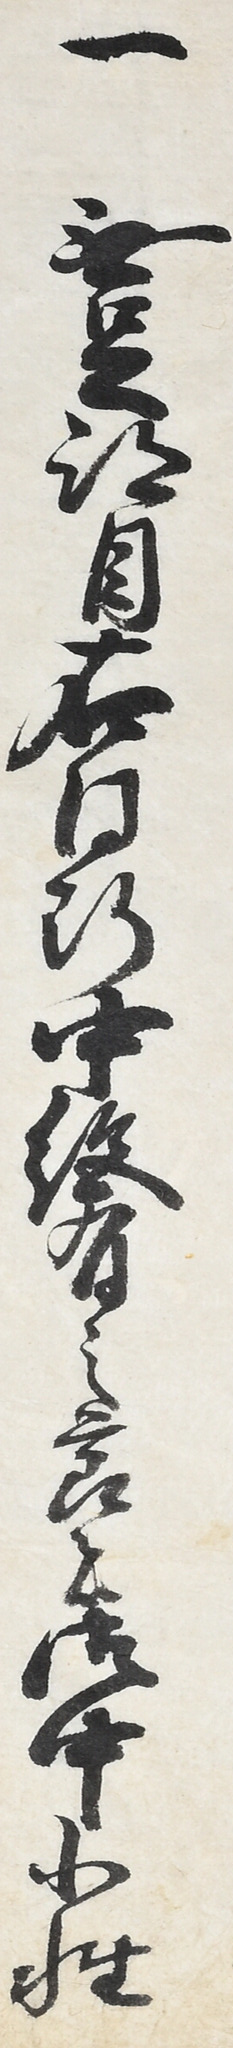一無足跡目右同断中絶有之節は御中小姓
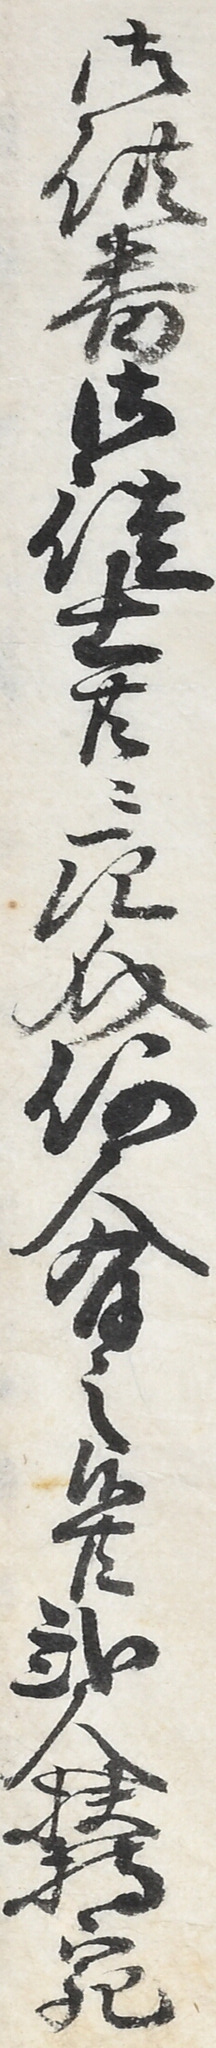御供番御徒士共ニ厄介何人有之候共弐人扶持宛

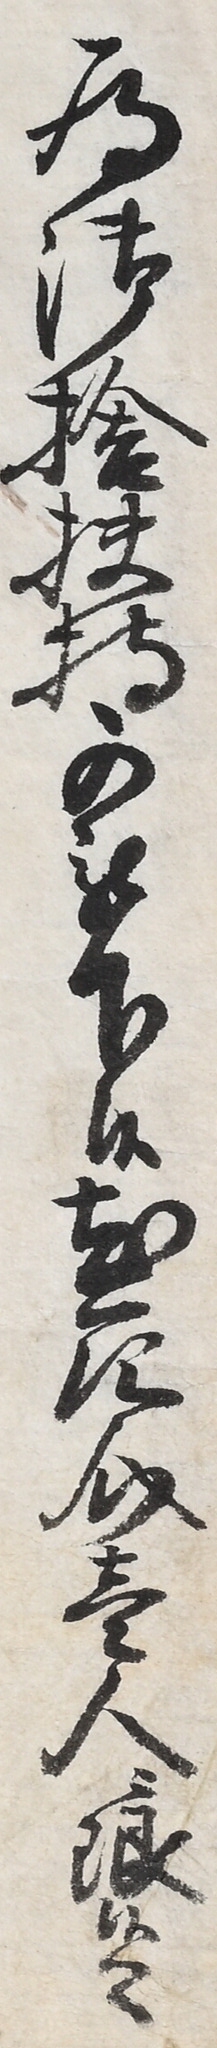為御捨扶持可被下候尤厄介壱人ニ限候ハヽ
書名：御給分渡方之定
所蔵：伊那市立高遠町図書館・合同会社AMANE
